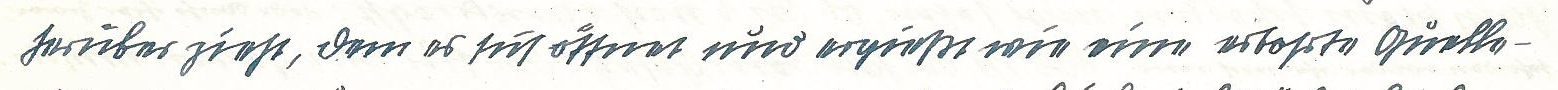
herüber zieht, dem es sich öffnet und ergießt wie eine erbohrte Quelle –
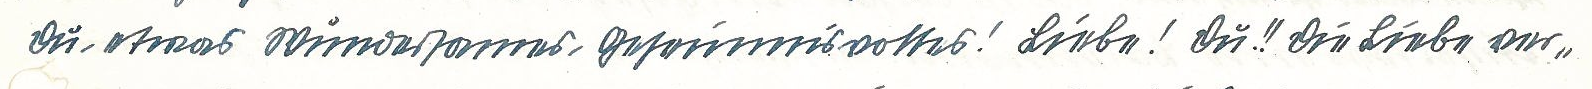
Du, etwas Wundersames, Geheimnisvolles! Liebe! Du!! Die Liebe ver¬
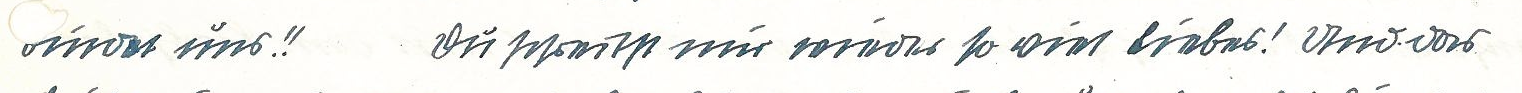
indet uns!! Du schreibst mir wieder so viel Liebes! Und das
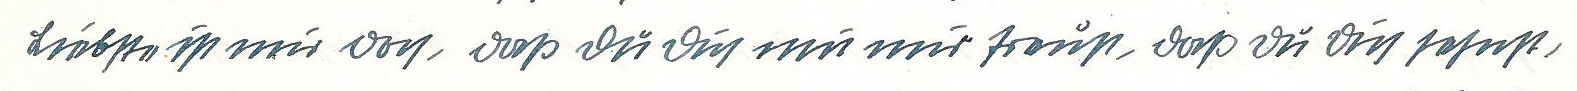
Liebste ist mir doch, daß Du Dich mit mir freust, daß Du Dich sehnst,
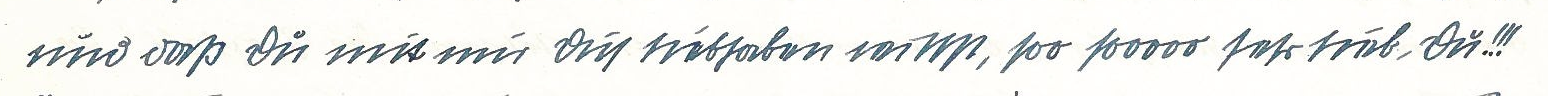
und daß Du mit mir Dich liebhaben willst, soo sooooo sehr lieb, Du!!!
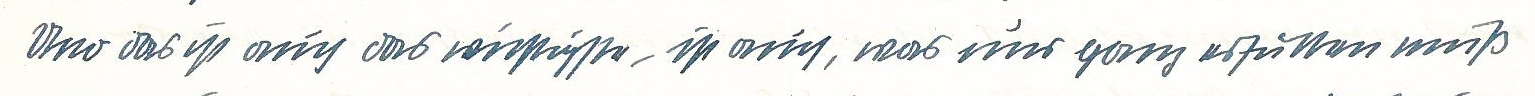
Und das ist auch das wichtigste, ist auch, was uns ganz erfüllen muß
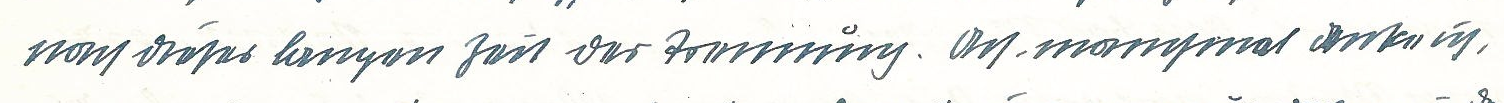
nach dieser langen Zeit der Trennung. Ach, manchmal denke ich,
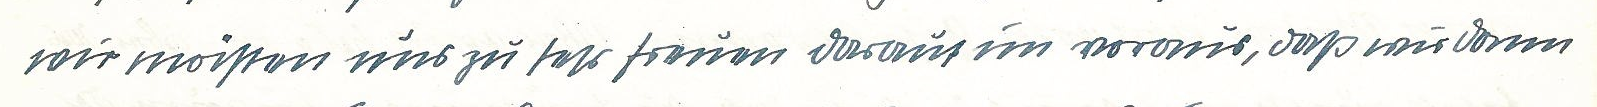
wir möchten uns zu sehr freuen darauf im voraus, daß wir dann
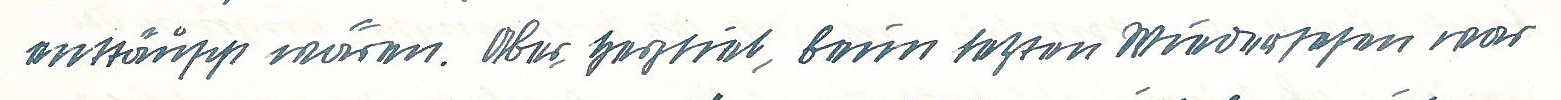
enttäuscht wären. Aber, Herzlieb, beim letzten Wiedersehen war
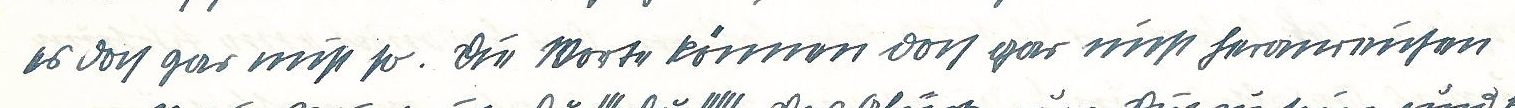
es doch gar nicht so. Die Worte können doch gar nicht heranreichen
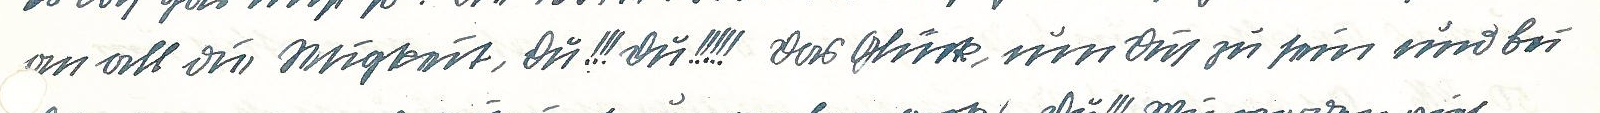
an all die Seligkeit, Du!!! Du!!!!! Das Glück, um Dich zu sein und bei
